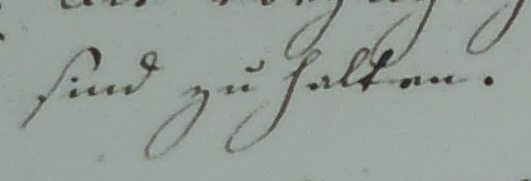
sind zu halten.
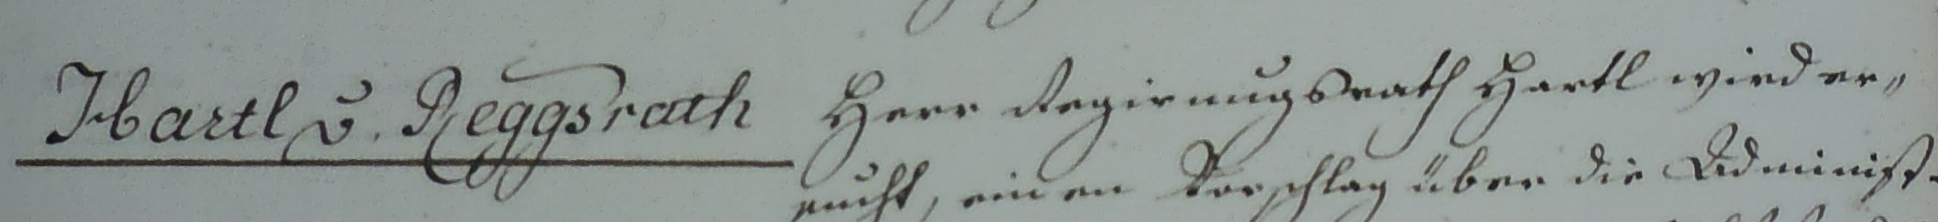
Hartl v.Reg͞gsrath Herr Regirungsrath Hartl wird er¬
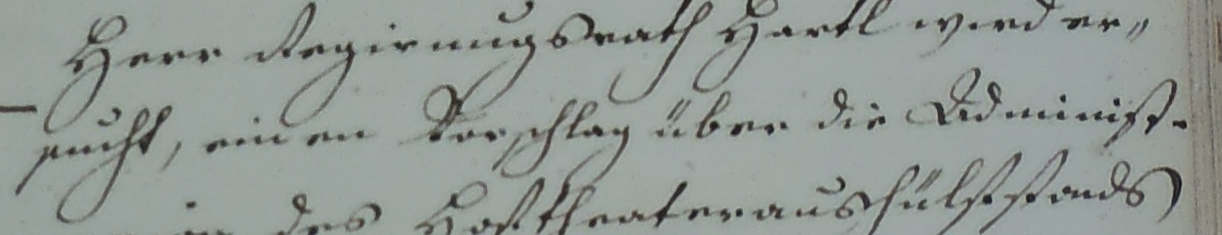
sucht, einen Vorschlag über die Administ¬
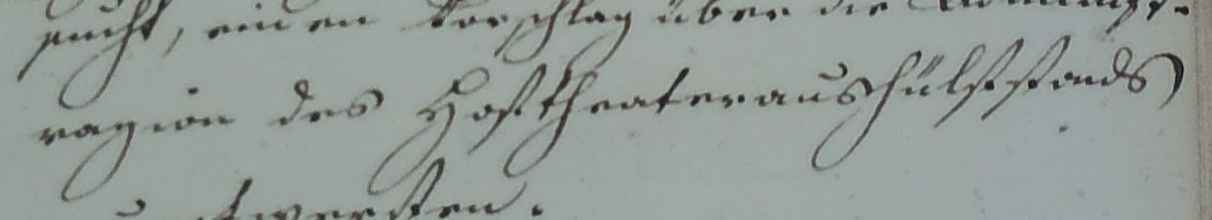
razion des Hoftheateraushülffonds
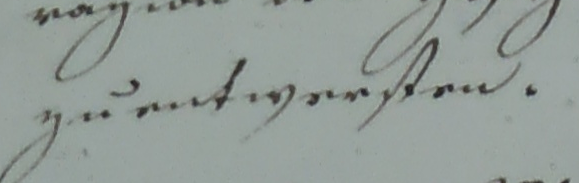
zu entwerfen.
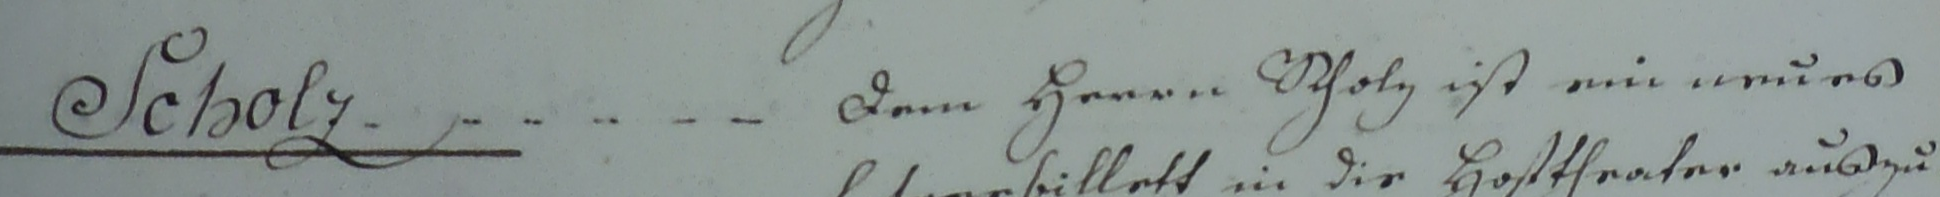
Scholz .. .. .. .. .. .. Dem Herrn Scholz ist ein neues
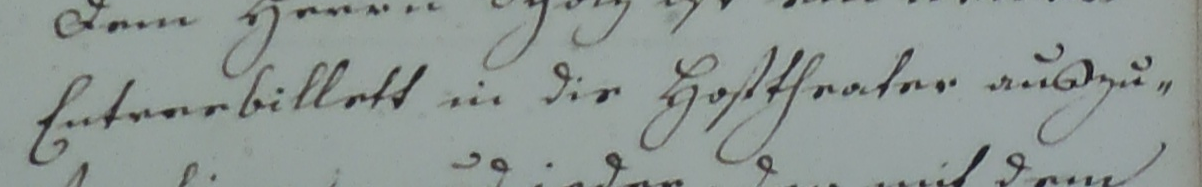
Entreebillett in die Hoftheater auszu¬
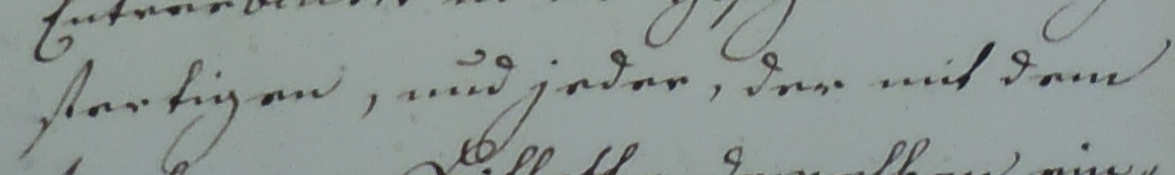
fertigen, und jeder, der mit dem
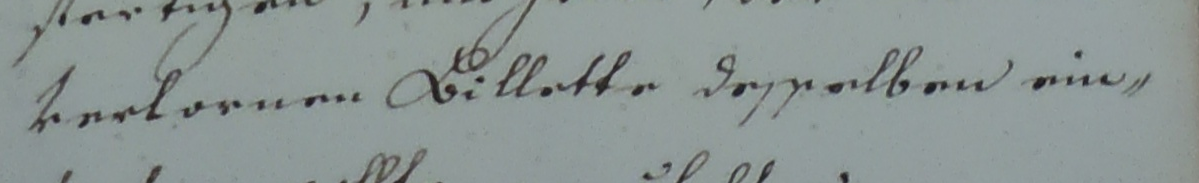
verlornen Billette desselben ein¬
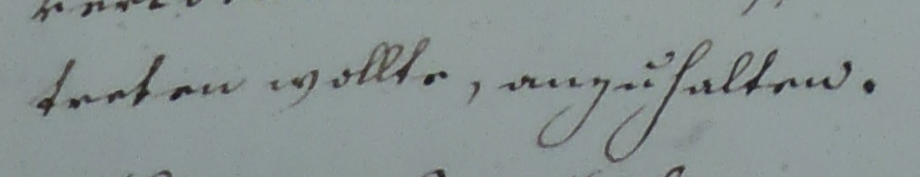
treten wollte, anzuhalten.
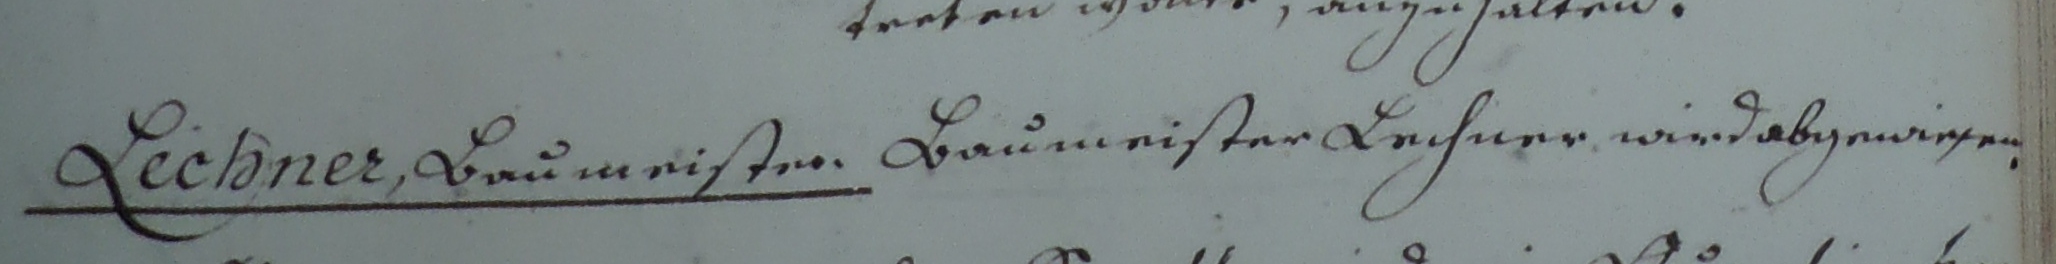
Lechner, Baumeister Baumeister Lechner wird abgewiesen.
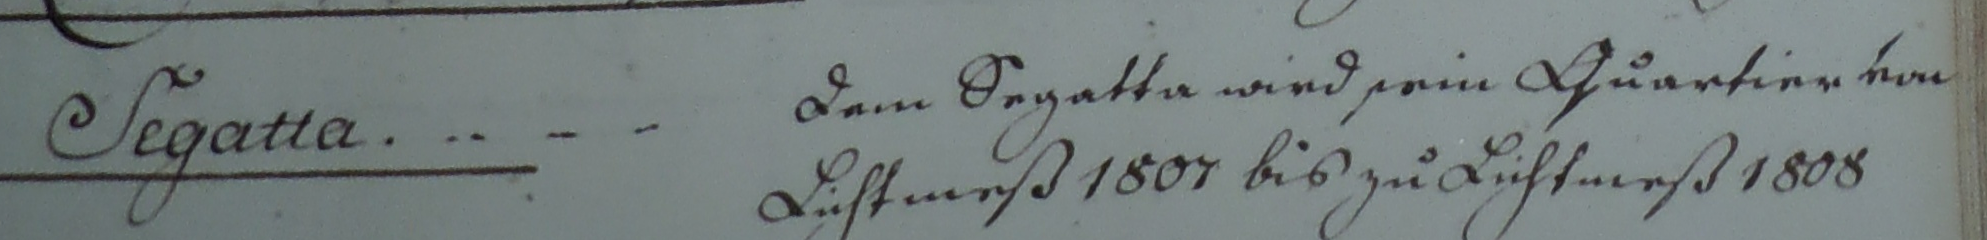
Segatta. .. .. .. Dem Segatta wird sein Quartier von
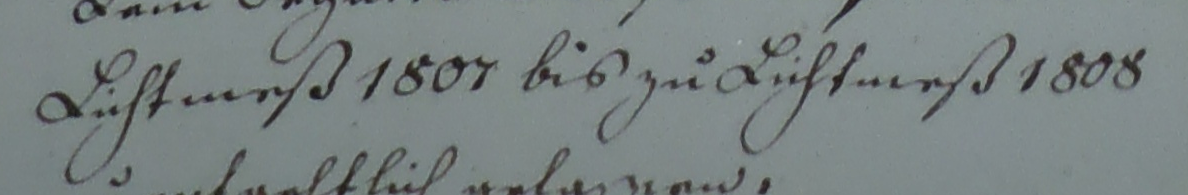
Lichtmeß 1807 bis zu Lichtmeß 1808
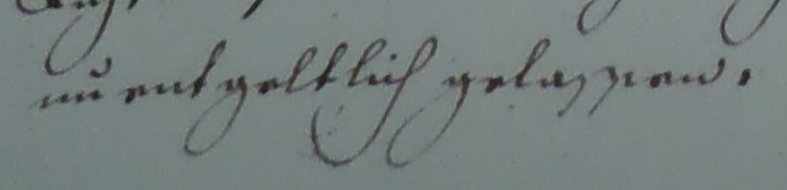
unentgeltlich gelassen.
